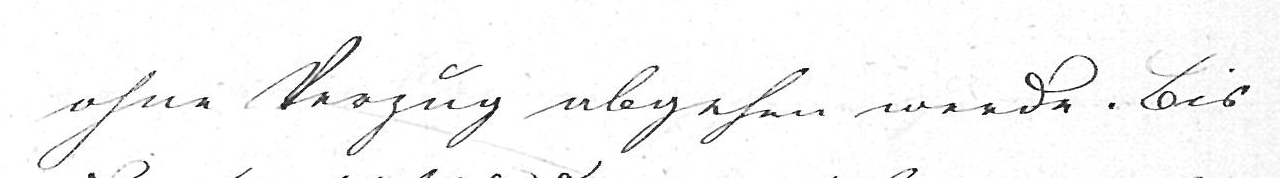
ohne Verzug abgehen werde. Bis
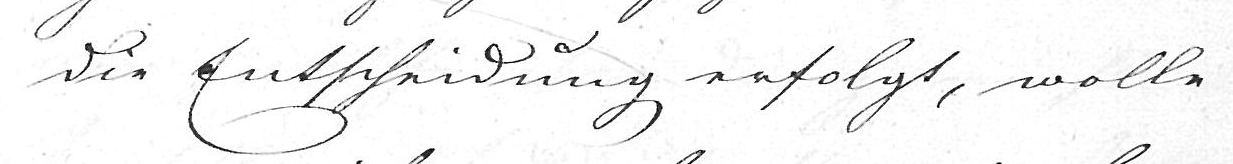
die Entscheidung erfolgt, wolle
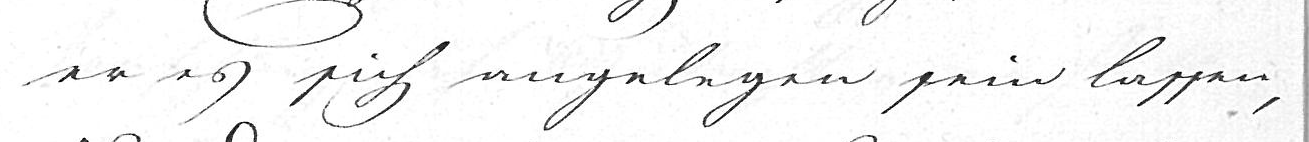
er es sich angelegen sein lassen,
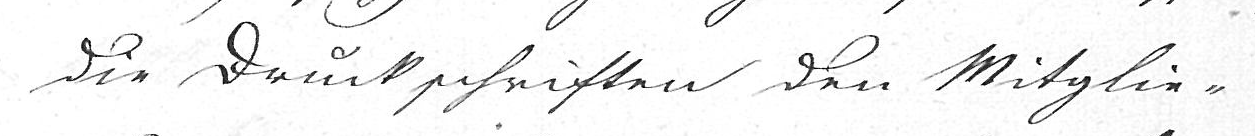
die Druckschriften den Mitglie-
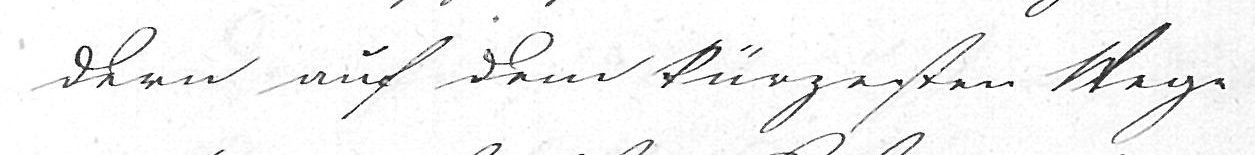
dern auf dem kürzesten Wege
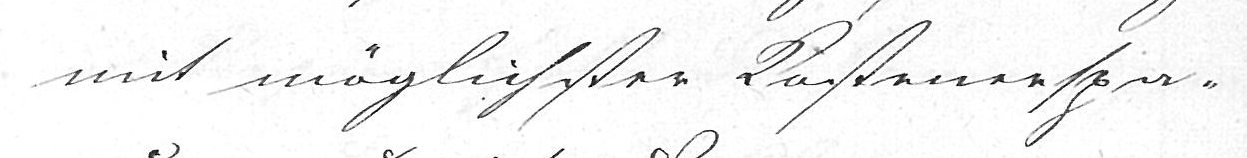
mit möglichster Kostenerspa-
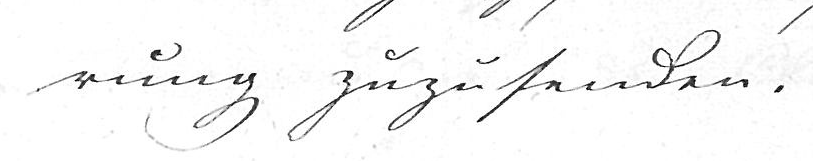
rung zuzusenden.
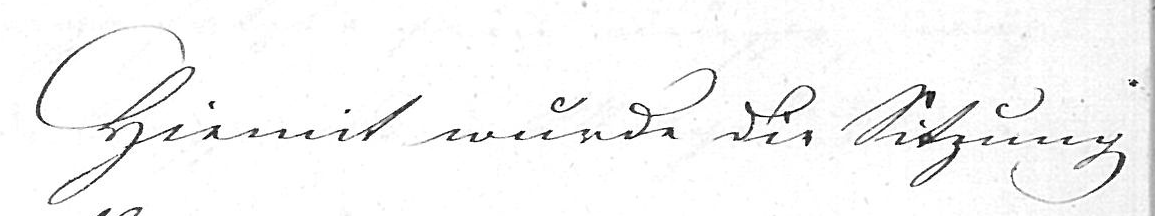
Hiemit wurde die Sitzung
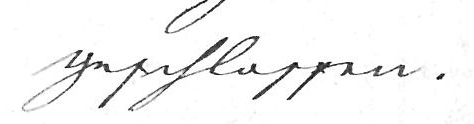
geschlossen.
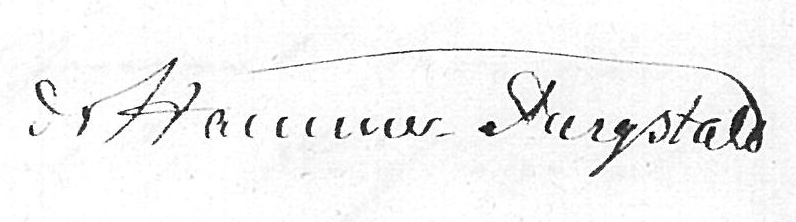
DvHammer-Purgstall
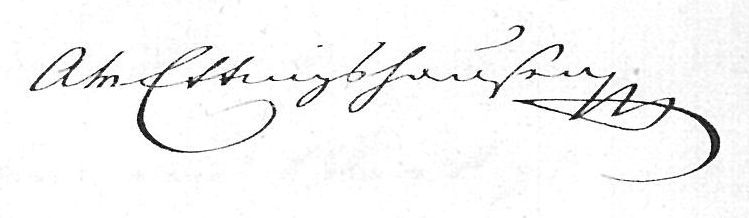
AvEttingshausen
